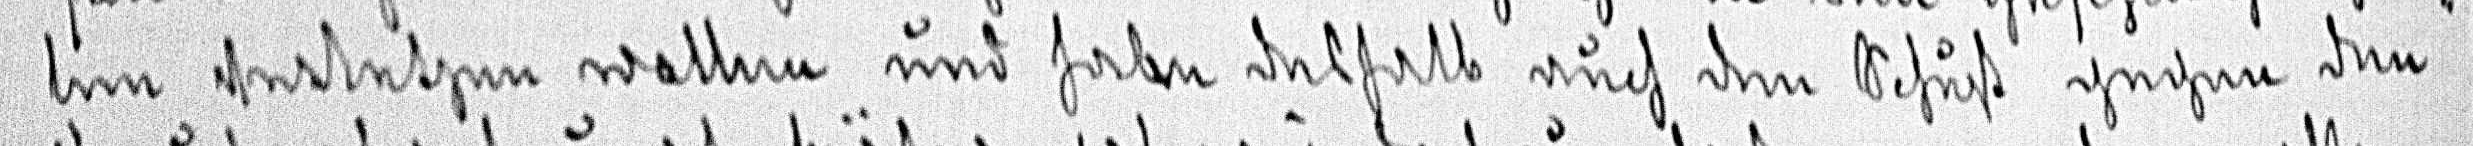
len verletzten wollen und habe deshalb auch den Schuß gegen den
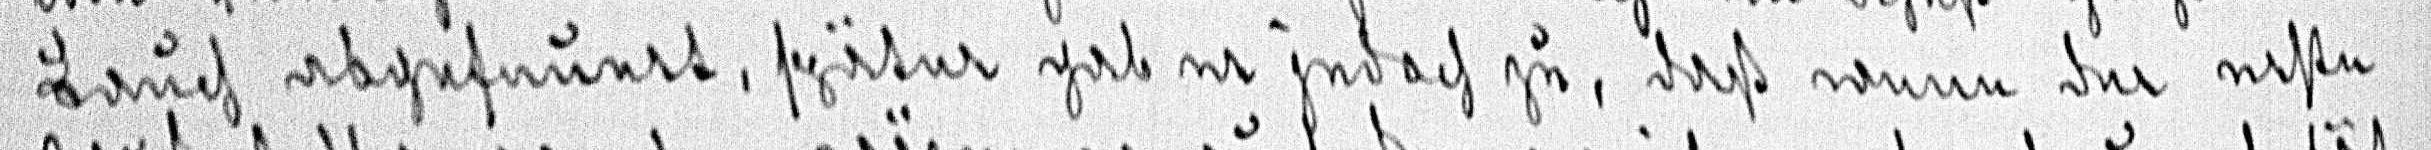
Bauch abgefeuert, später gab er jedoch zu, daß wenn der erste
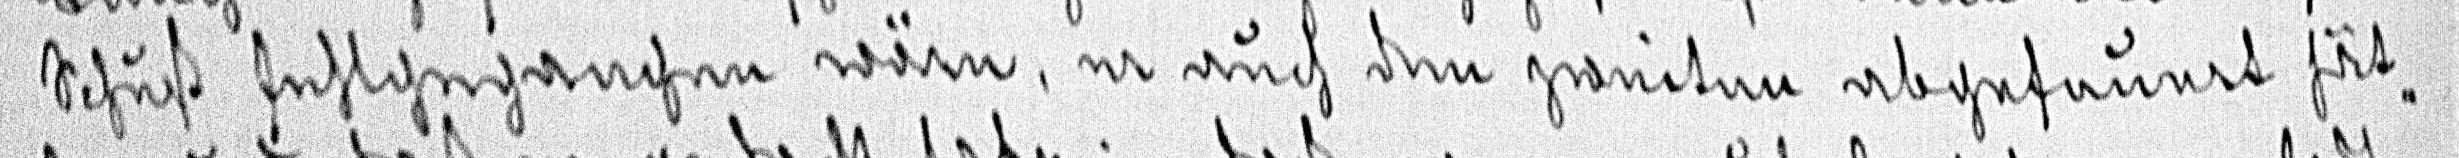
Schuß fehlgegangen wäre, er auch den zweiten abgefeuert hät¬
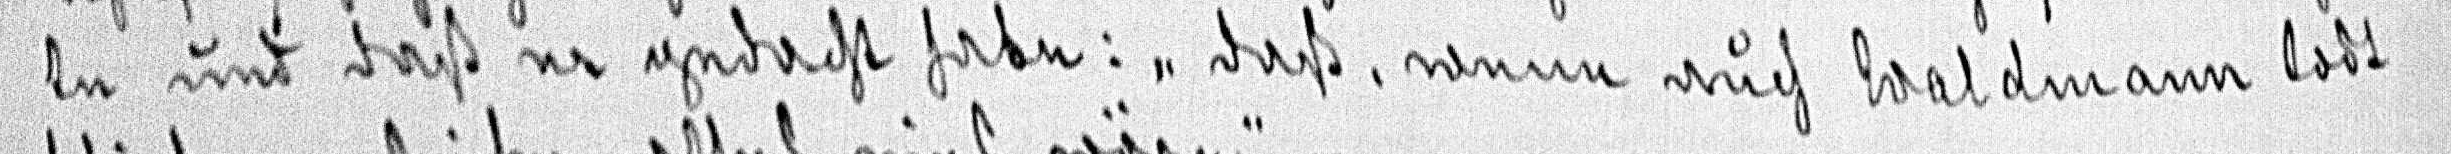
te und daß er gedacht habe: „daß, wenn auch Waldmann todt
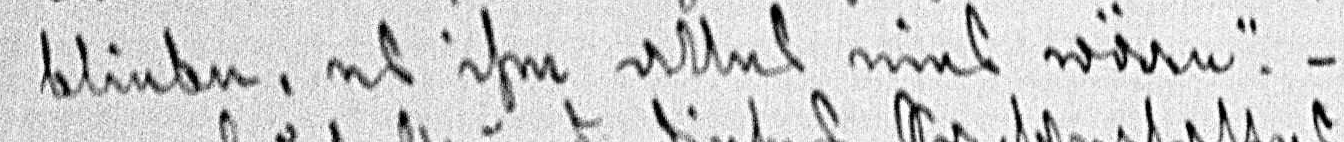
bliebe, es ihm alles eins wäre.“
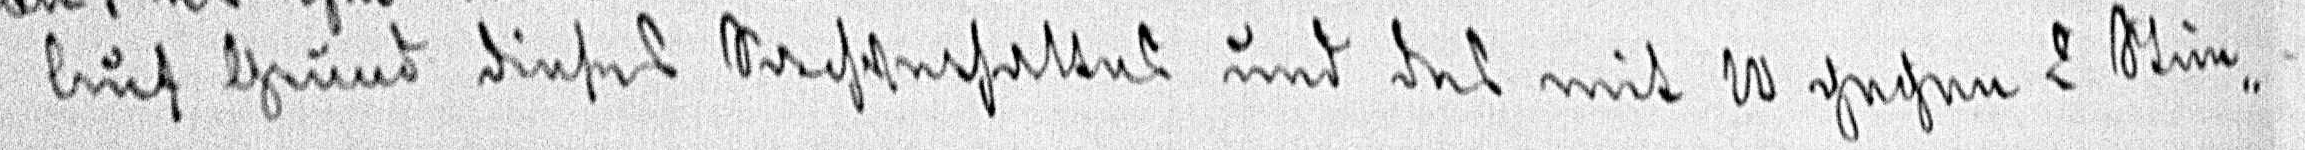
Auf Grund dieses Sachverhaltes und des mit 10 gegen 2 Stim¬
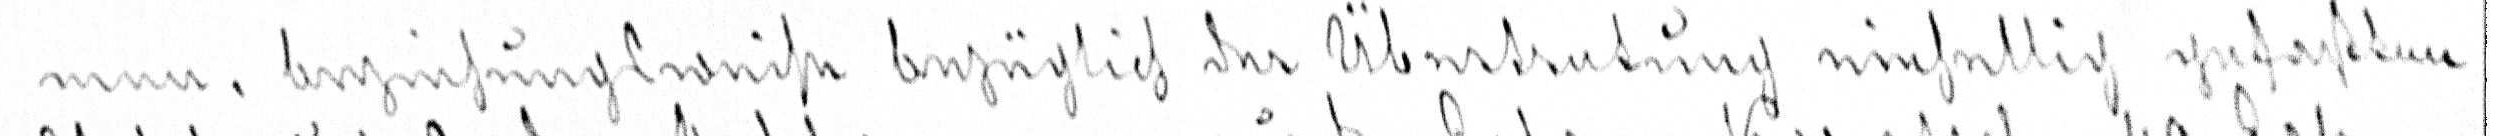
men, beziehungsweise bezüglich der Übertretung einhellig gefaßten
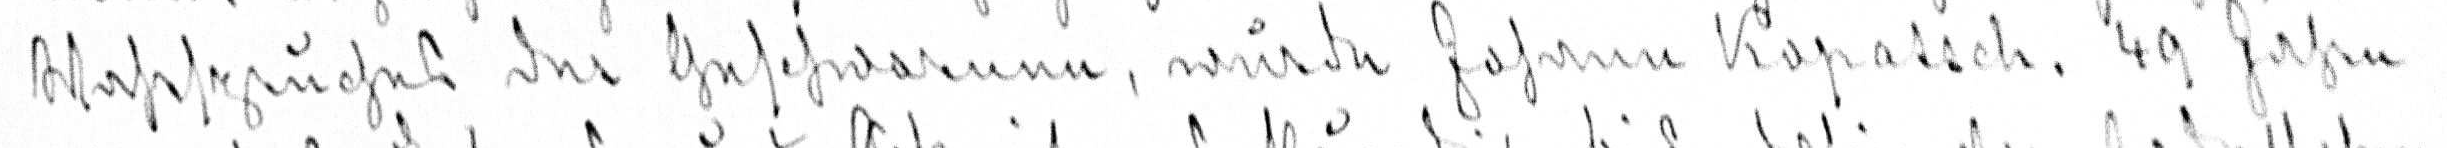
Wahrspruches des Geschworenen, wurde Johann Kopatsch, 49 Jahre
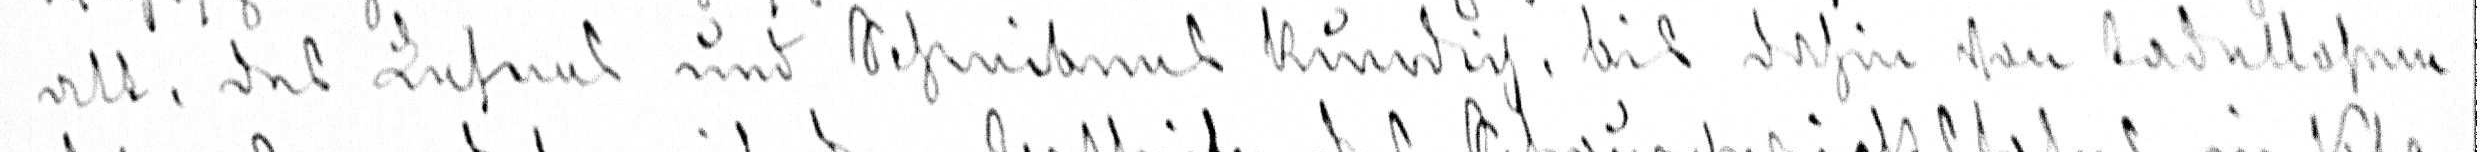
alt, des Lesens und Schreibens kündig, bis dahin von tadellosem
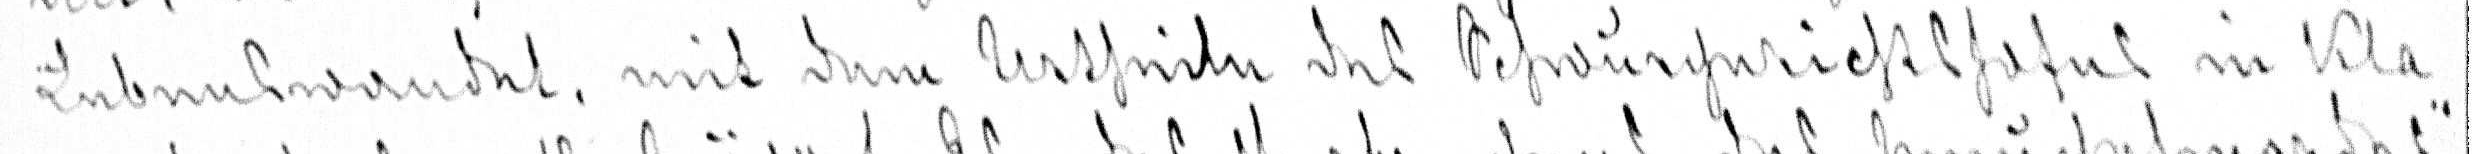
Lebenswandel, mit dem Urtheilen des Schwurgerichtshofes in Kla¬
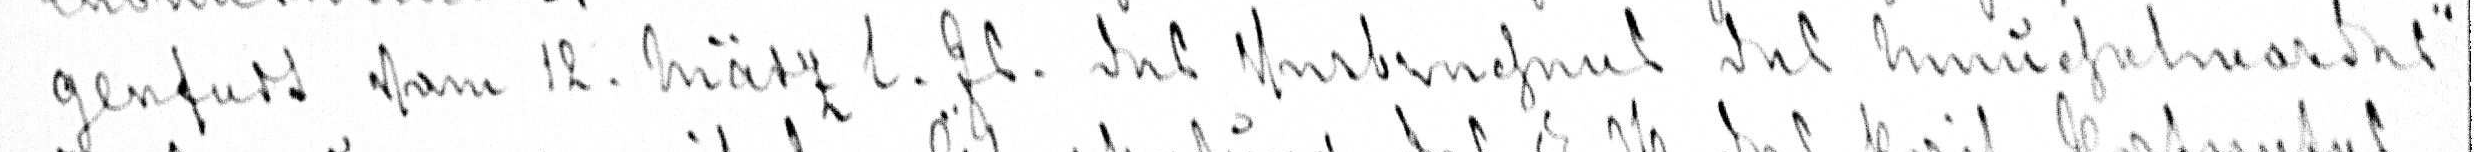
genfurt vom 12. März l. Js. des Verbrechens des Meuchelmordes
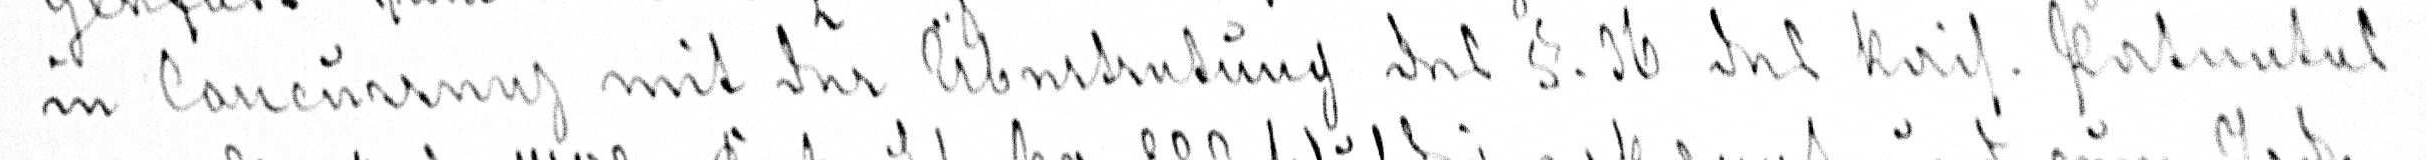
in Concurrenz mit der Übertretung des §36 des kais. Patentes
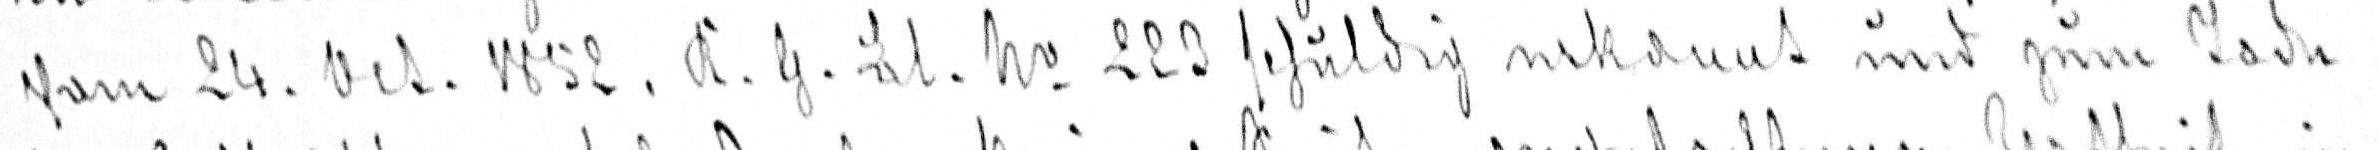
vom 24. Oct. 1852, R. G. Bl. No 223 schuldig erkannt und zum Tode
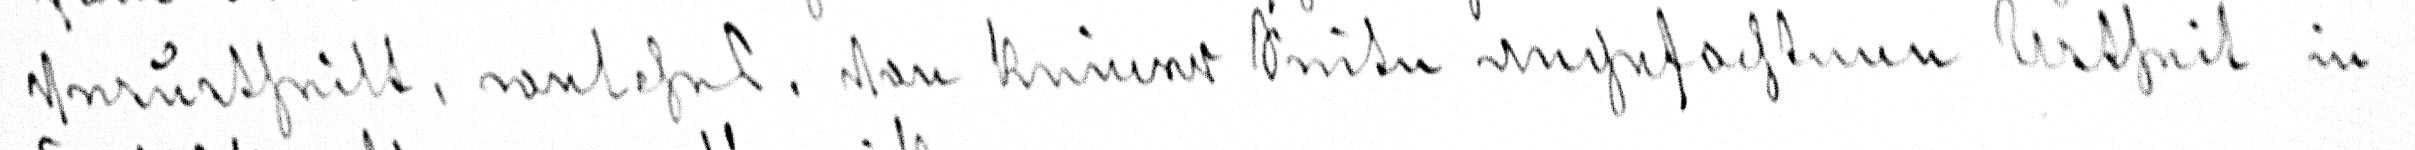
Verurtheilt, welches, von keiner Seite angefochtene Urtheil in
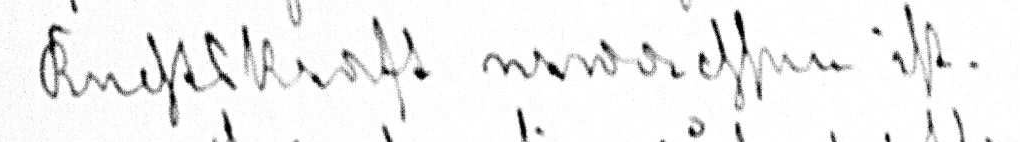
Rechtskraft erwachsen ist.
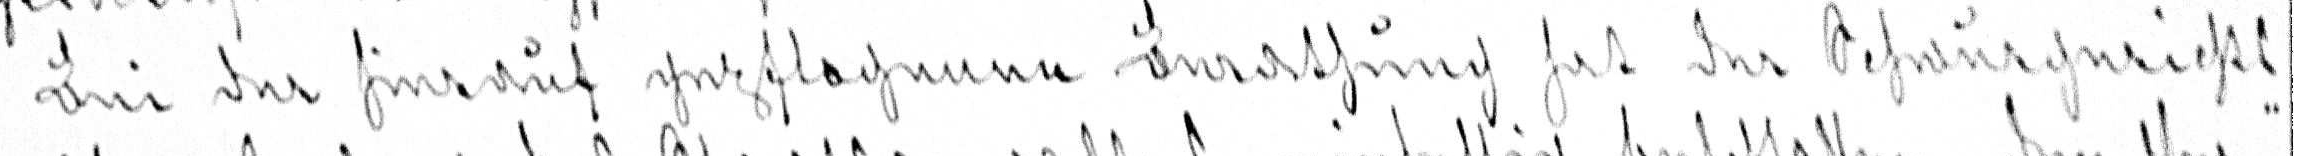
Bei der hierauf gepflogenen Berathung hat der Schwurgerichts¬
